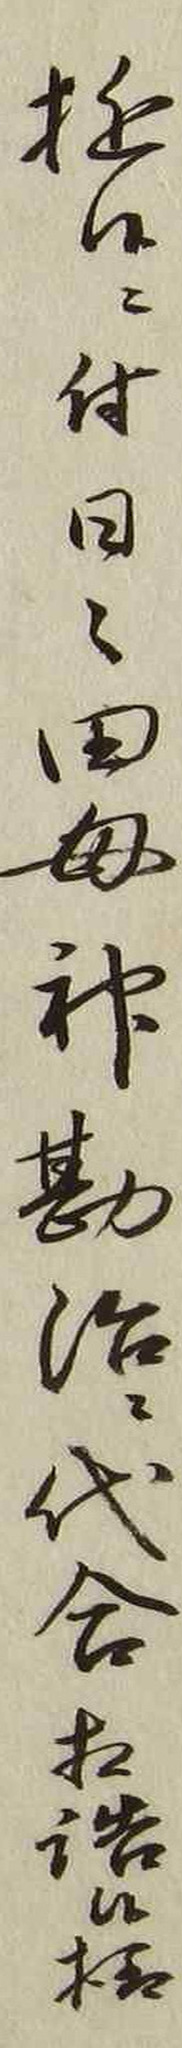遊候ニ付日々田母神勘治ニ代合相詰候様
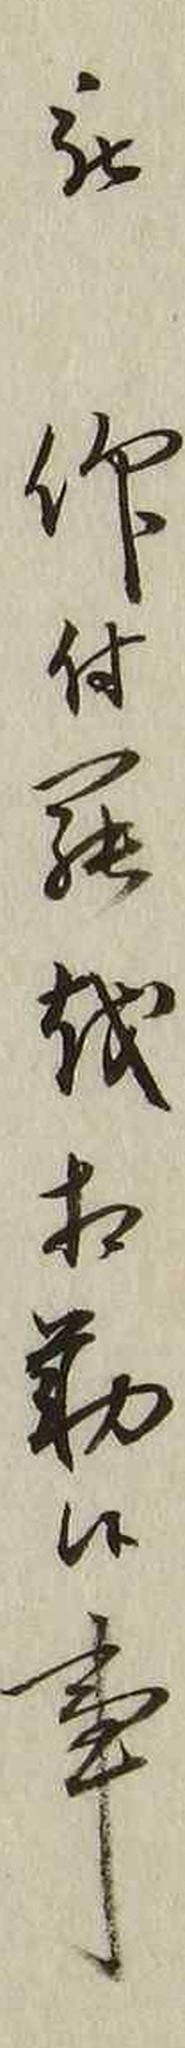被仰付罷越相勤候事
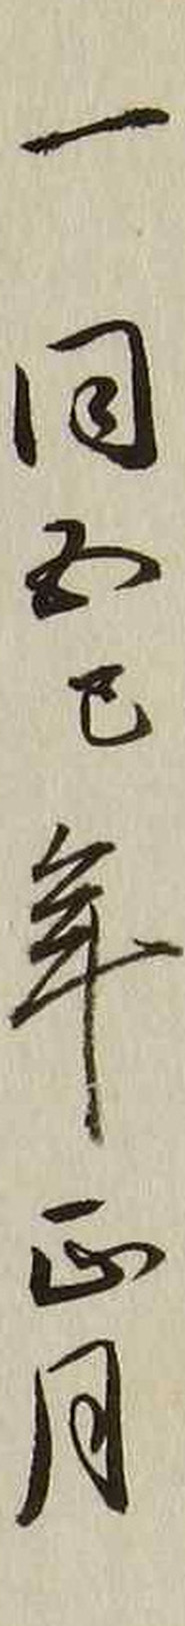一同五巳年正月
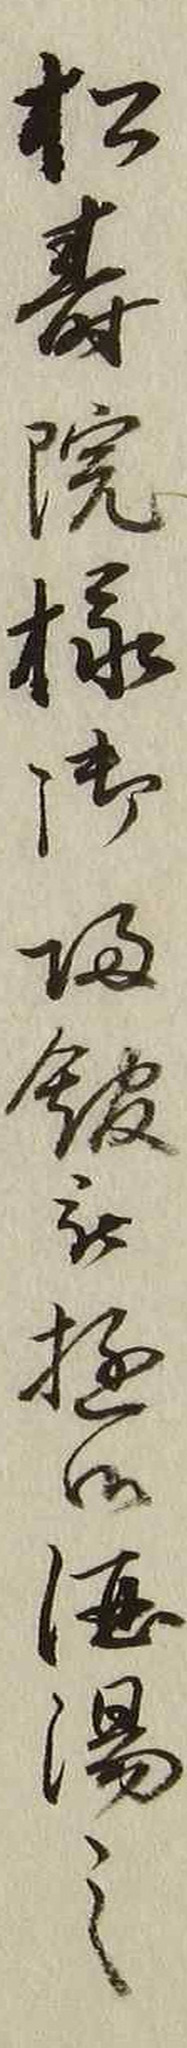松寿院様御帰館被遊候酒湯之
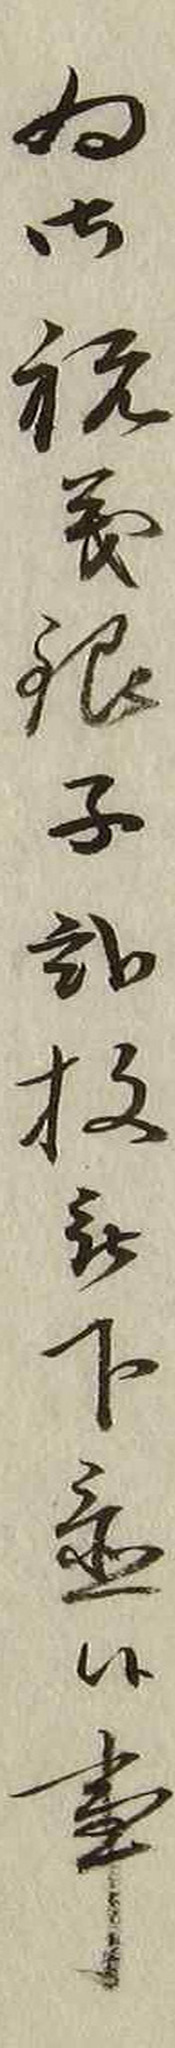為御祝義銀子弐枚被下置候事
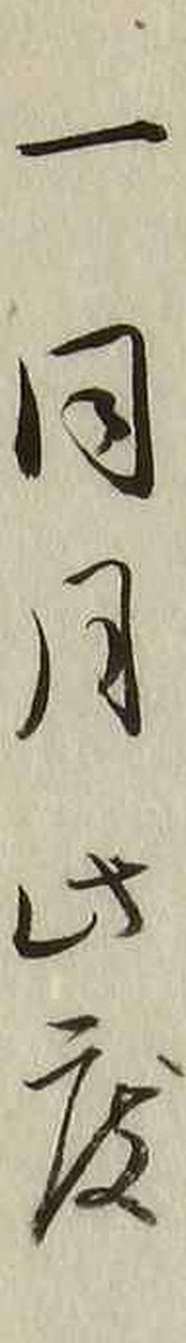一同月此度
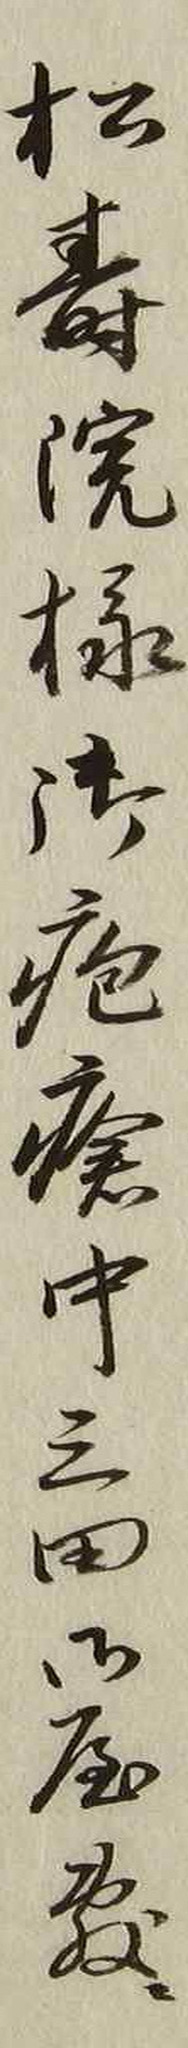松寿院様御疱瘡中三田御屋敷ニ
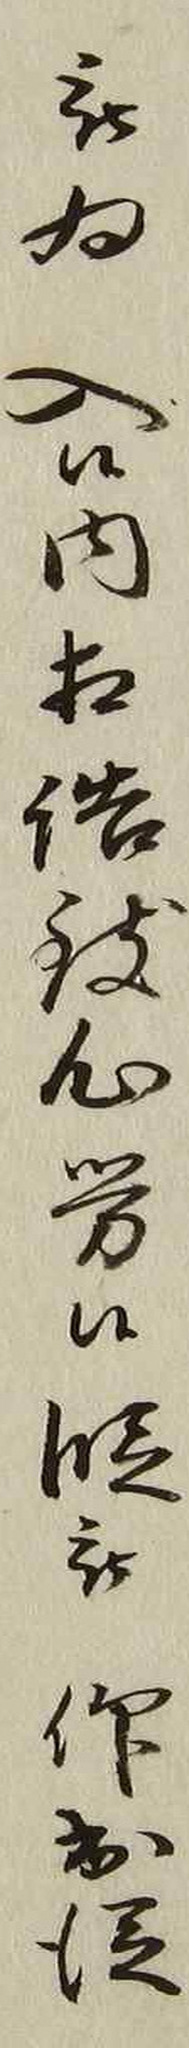被為入候内相詰致心労候段被仰出従
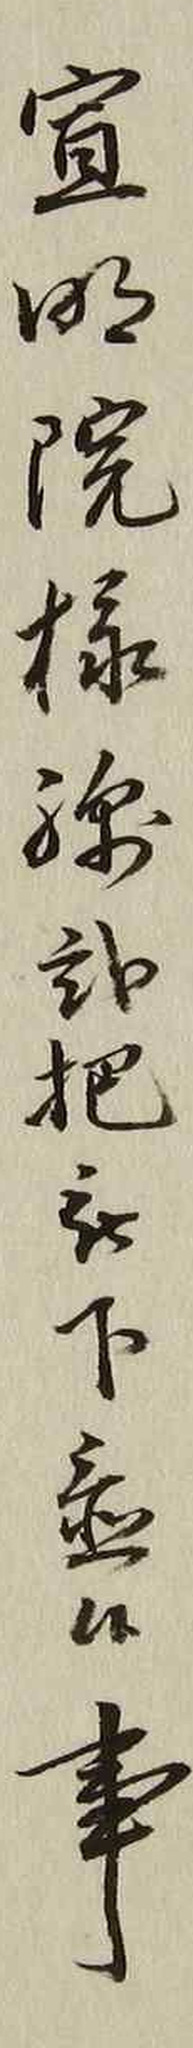宣明院様綿弐把被下置候事
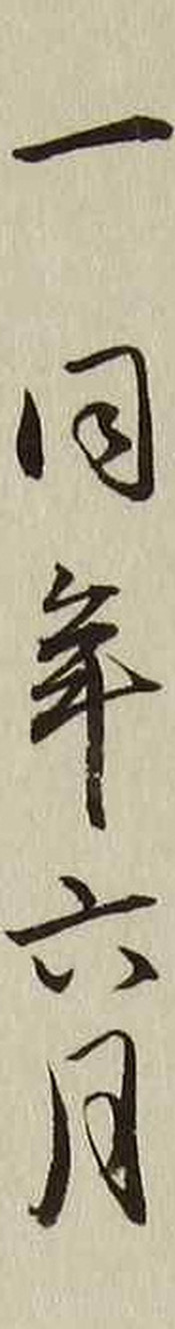一同年六月
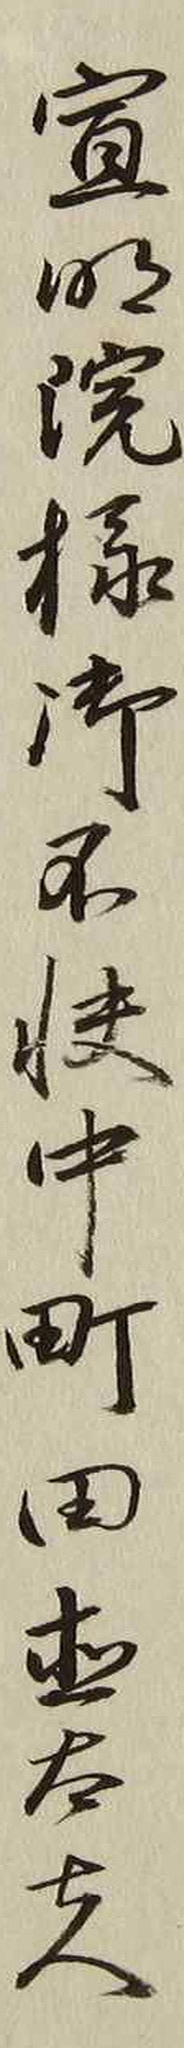宣明院様御不快中町田直太夫
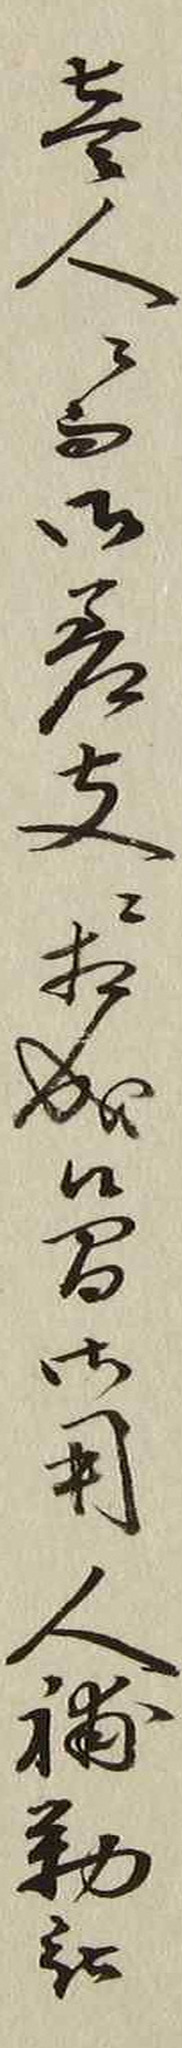壱人ニ而御差支ニ相成候間御用人補勤被
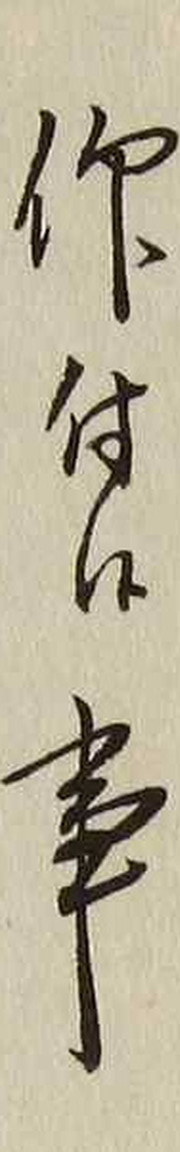仰付候事
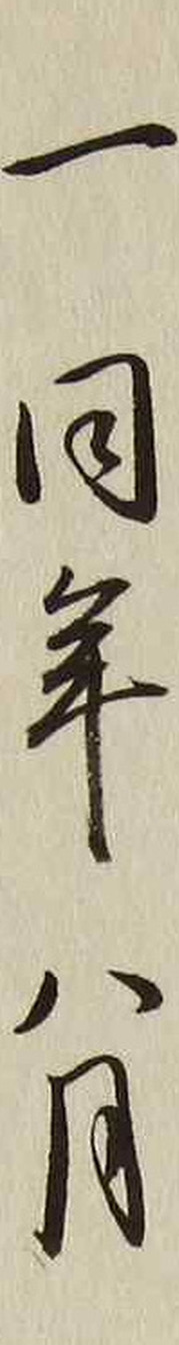一同年八月
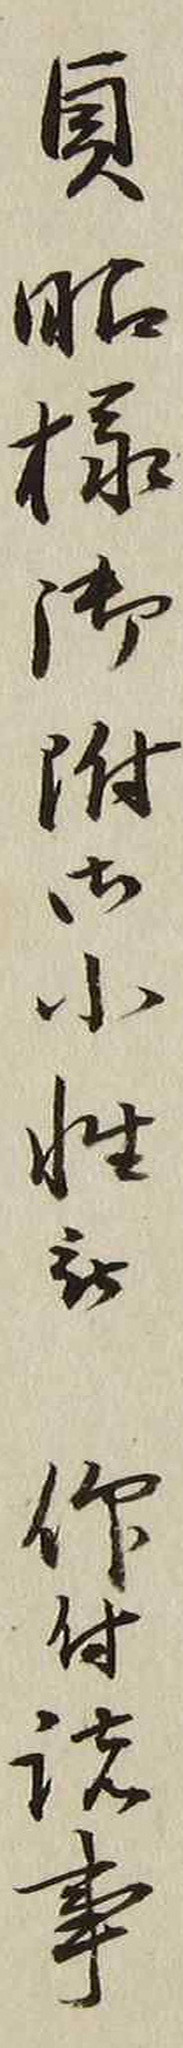貞昭様御附御小姓被仰付諸事
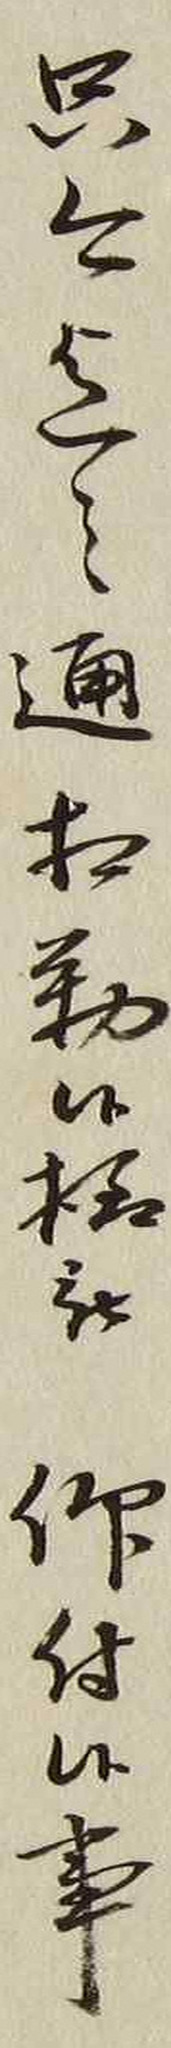只今迄之通相勤候様被仰付候事
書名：諸士系譜　巻之160　な之部2
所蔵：会津若松市立会津図書館
